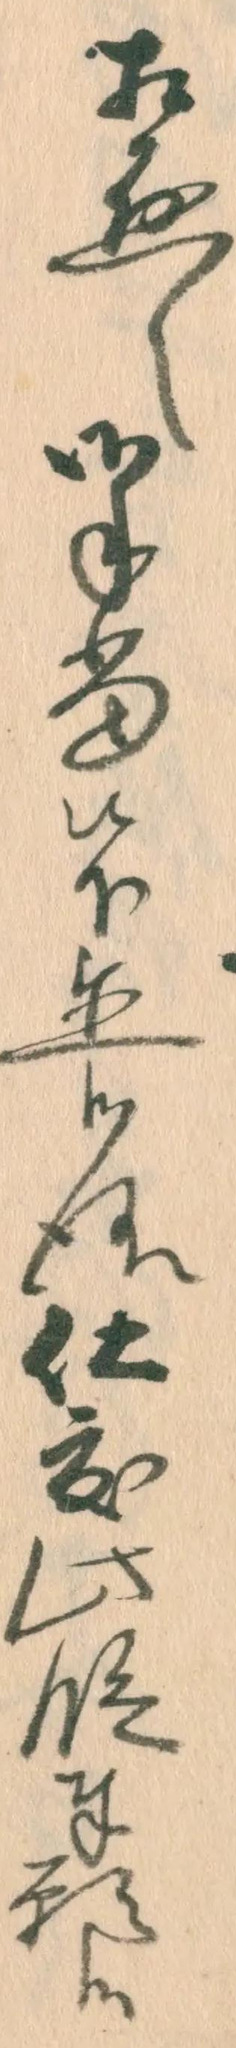相応之御手当被下置候様仕度此段奉願候
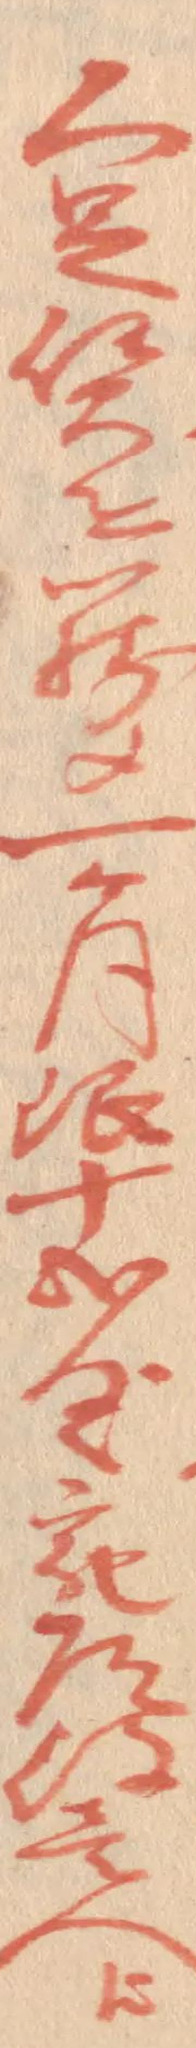人足賃を籠メ一ヶ月銀十弐匁宛道役壱人え
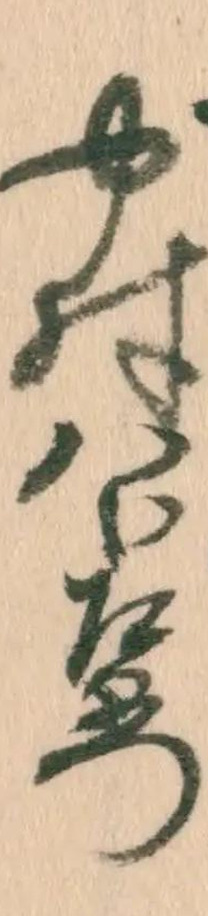月中村八郎左衛門
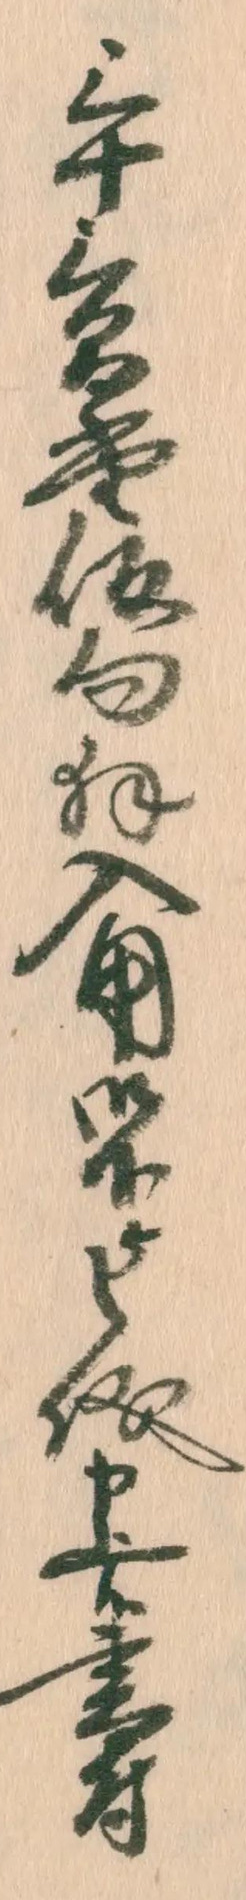│三十三間堂仮向拝入用御下ヶ之儀申上候書付
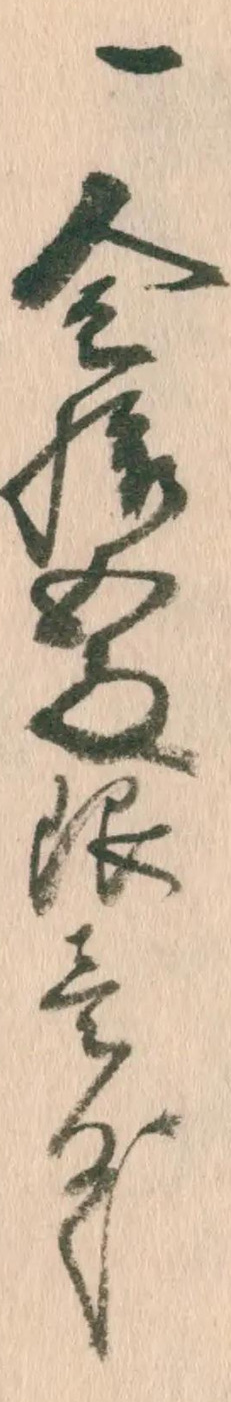一金拾五両銀壱匁
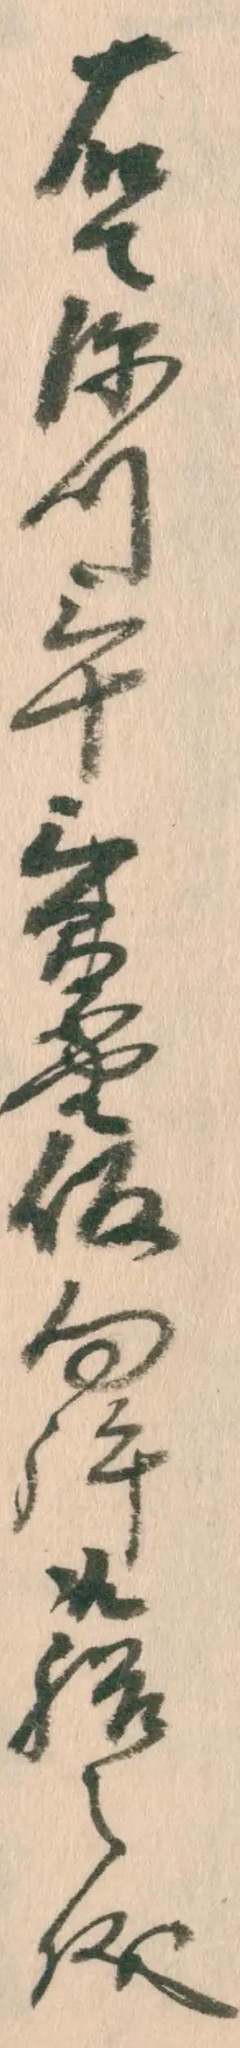右は深川三十三間堂仮向拝取繕之儀
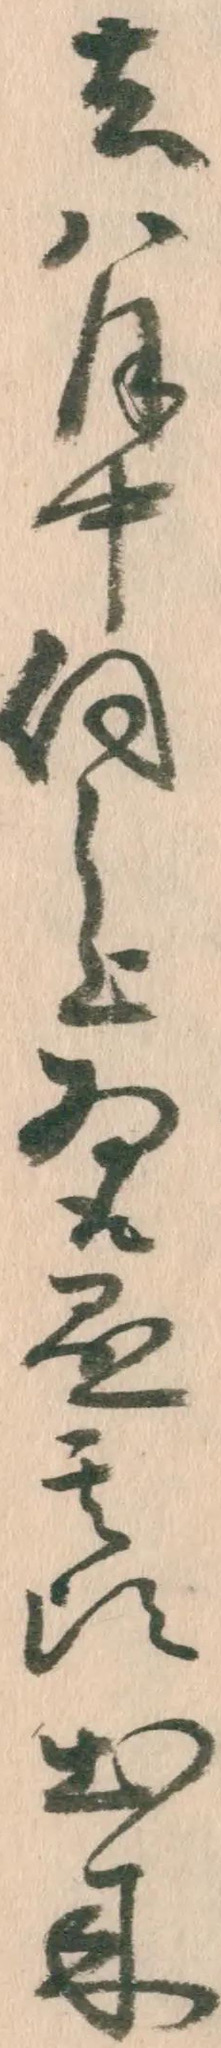去八月中伺之上為取懸其頃出来

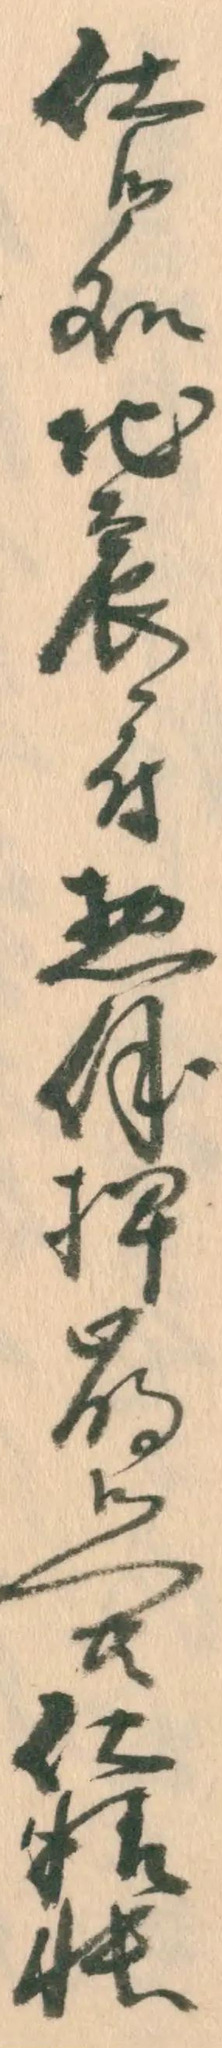仕候処地震に付惣体押崩候へ共仕様帳
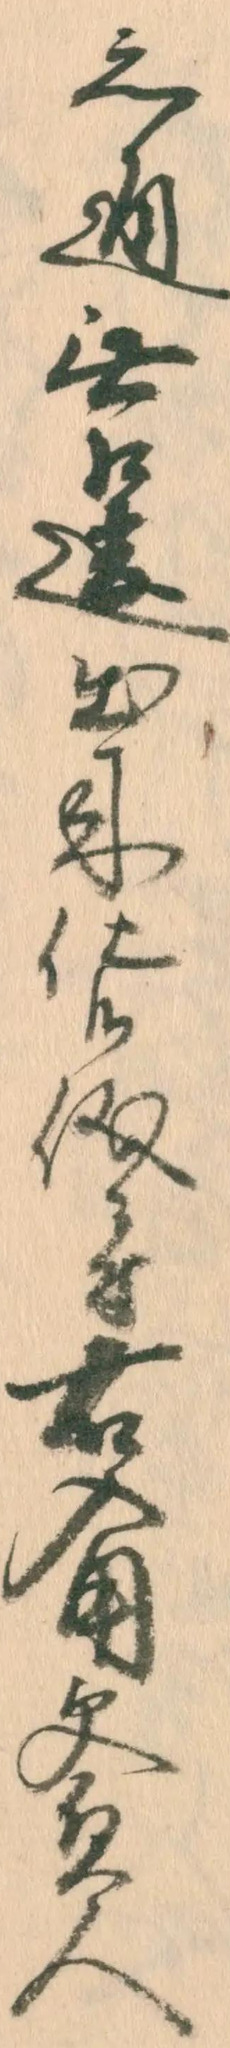之通無相違出来仕候儀に付右入用受負人
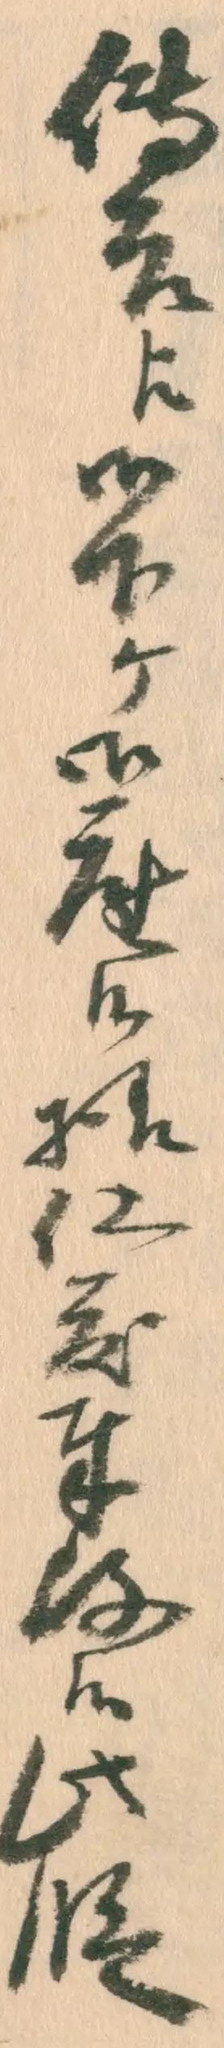伝吉え御下ヶ御座候様仕度奉存候此段
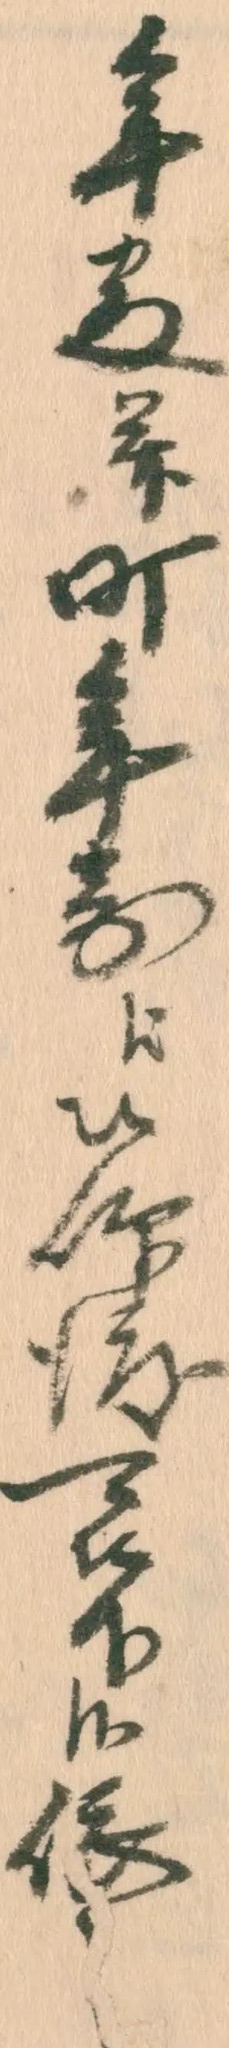年番幷町年寄え被仰渡可被下候依之
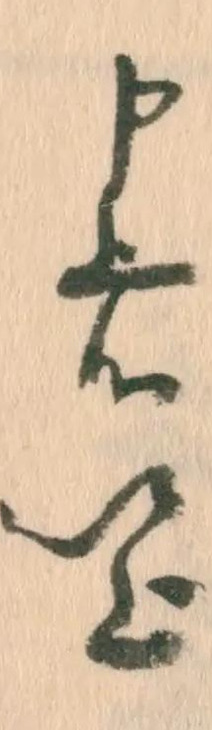申上候以上
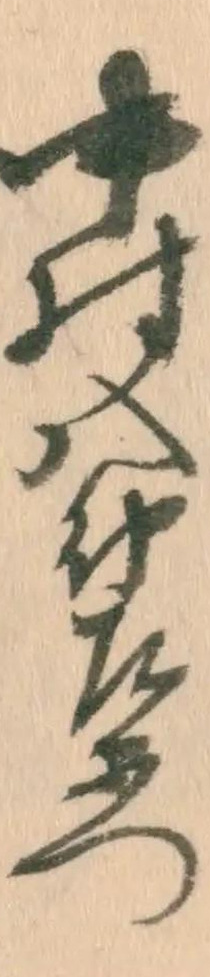中村八郎左衛門
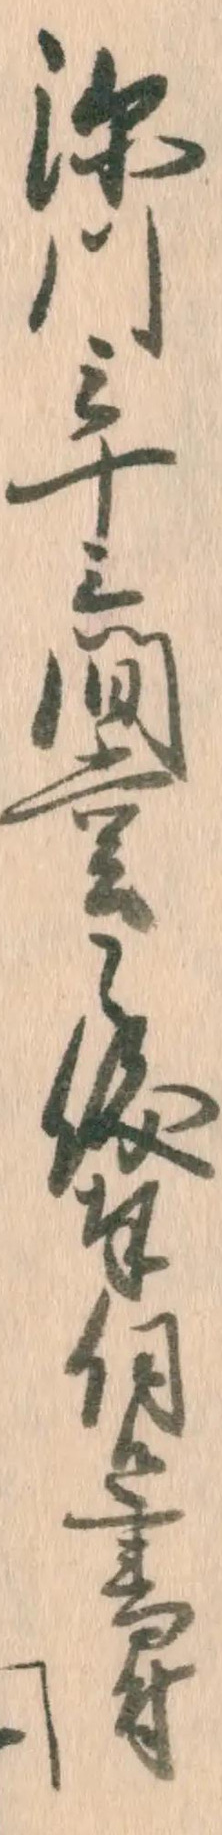│深川三十三間堂之儀奉伺候書付
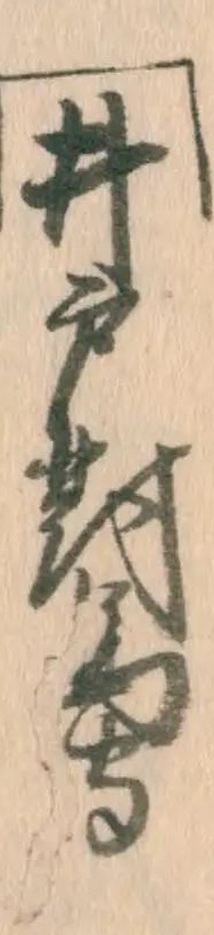│井戸対馬守
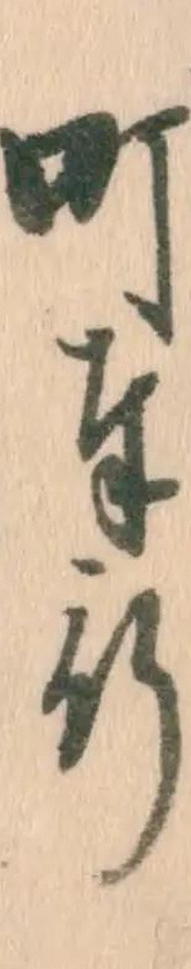│町奉行
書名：三十三間堂. [1]
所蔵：国立国会図書館 National Diet Library, JAPAN
